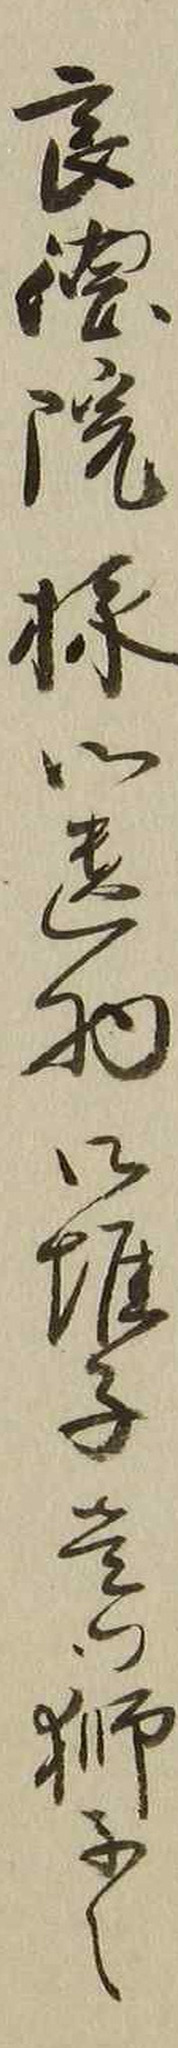良徳院様御遺物御帷子壱つ獅子之香炉
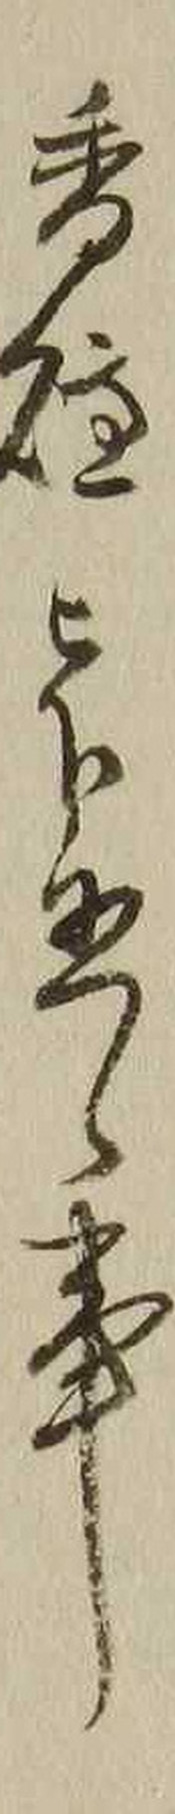香炉被下置候事
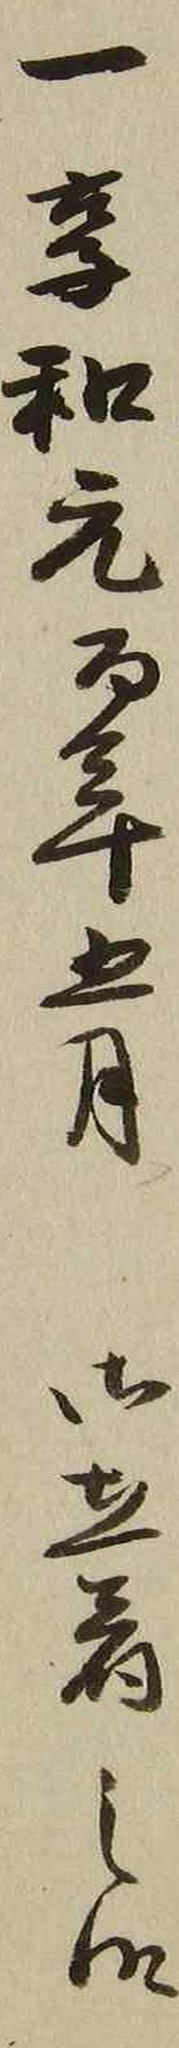一享和元酉年五月御在着之御
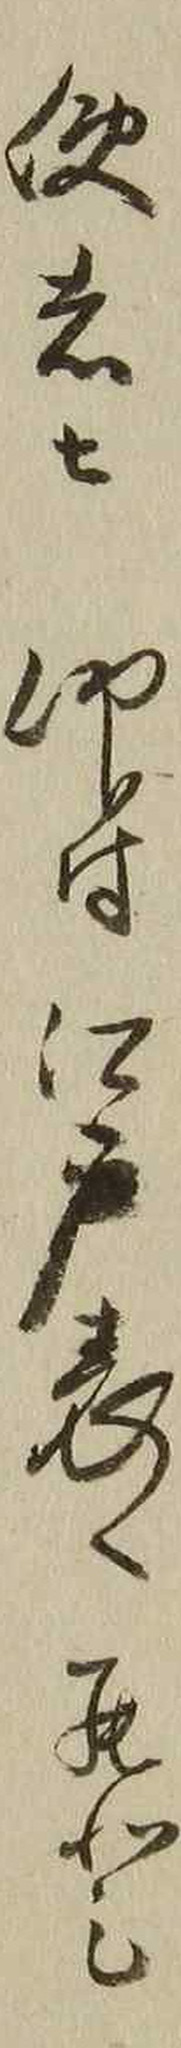使者日仰付江戸表へ罷登
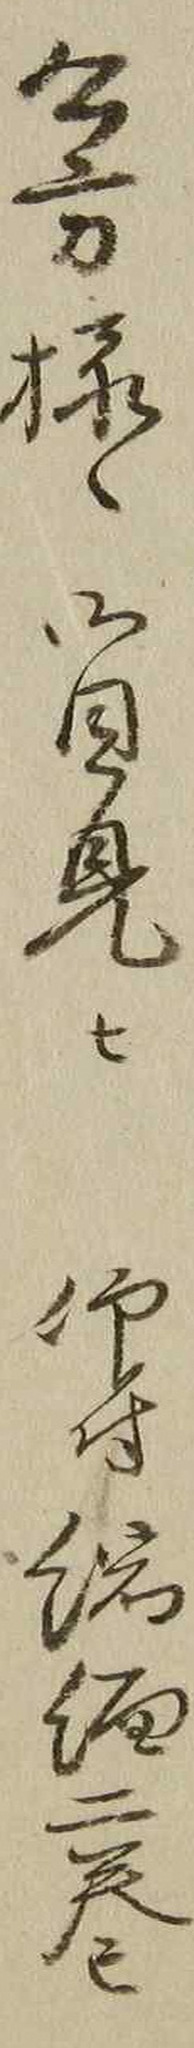公方様へ御目見被仰付縮緬二巻
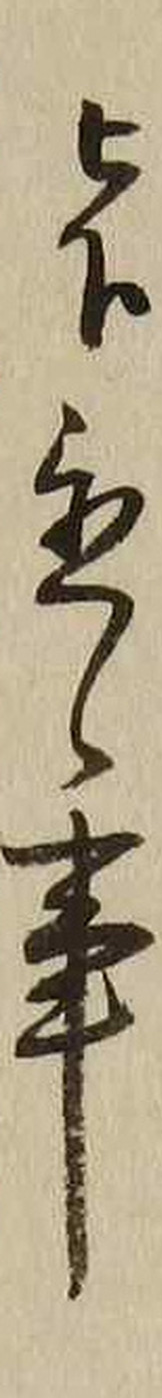被下置候事
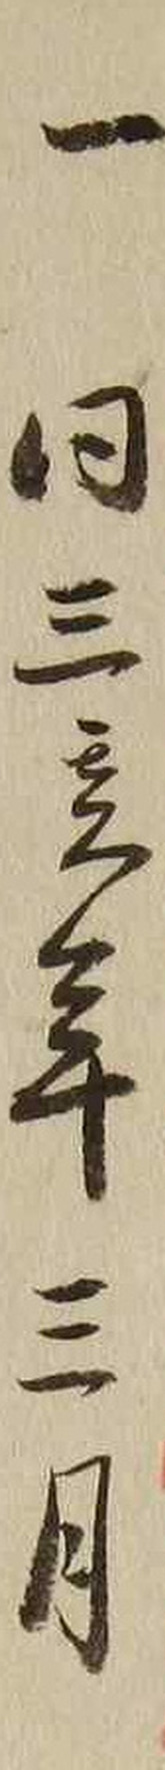一同三亥年三月
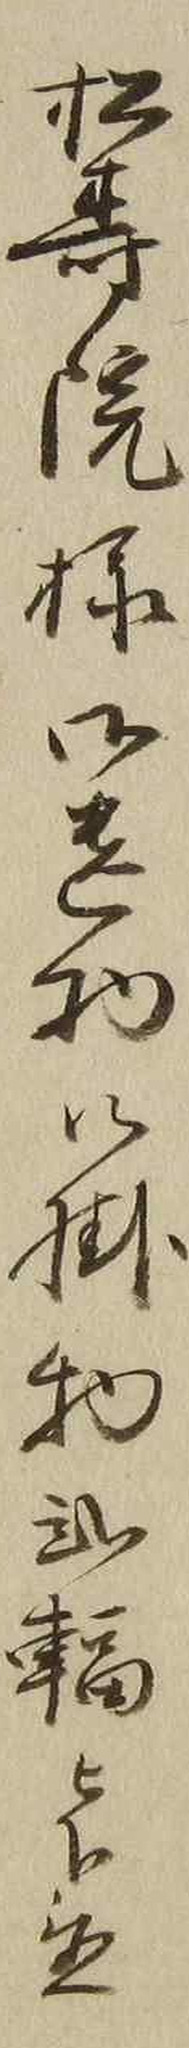松寿院様御遺物御掛物弐輻被下置
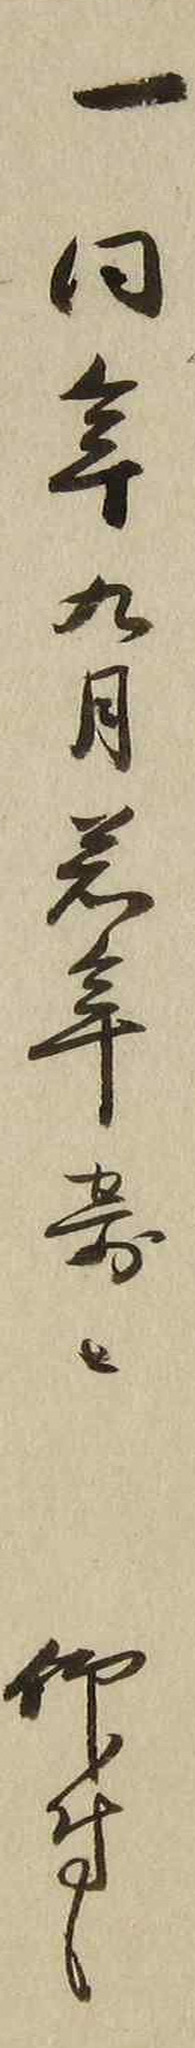一同年九月若年寄被仰付候
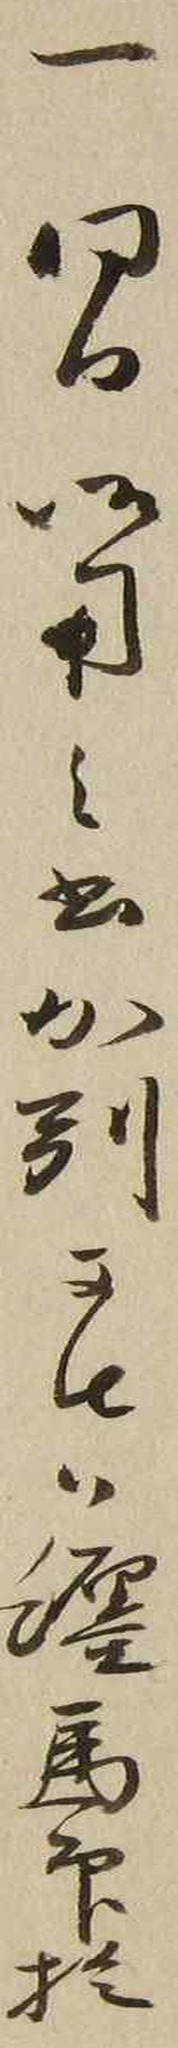一同日御用之書加判可仕候纒馬印於
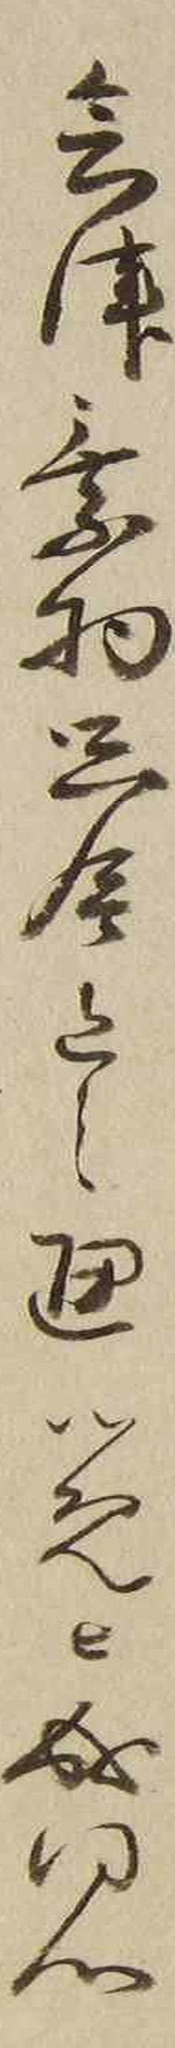会津乗物只今迄之通御免被成同心
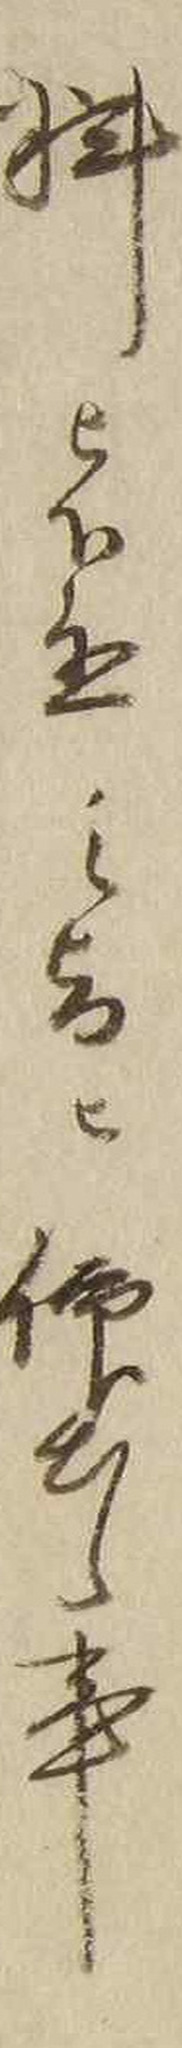料被下置之旨被仰出候事
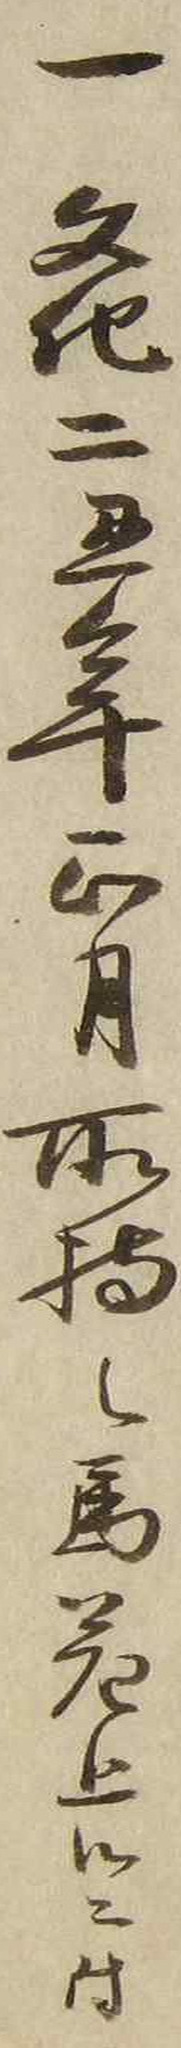一文化二丑年正月所持之馬差上候に付

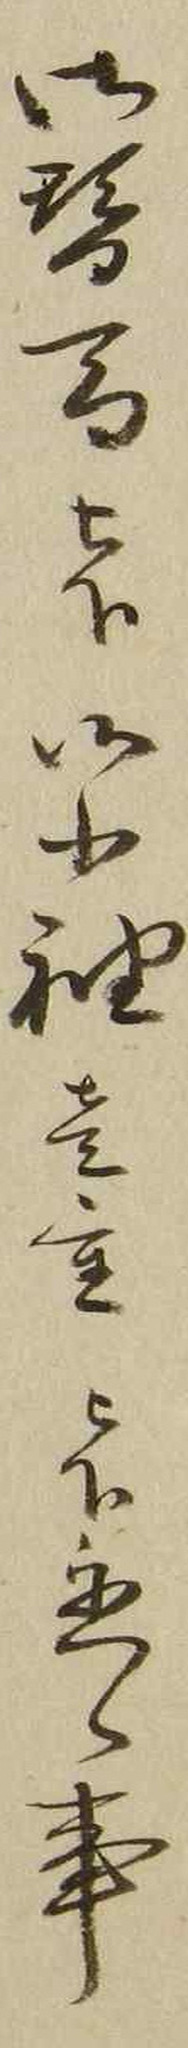御替馬被下御小袖壱重被下置候事
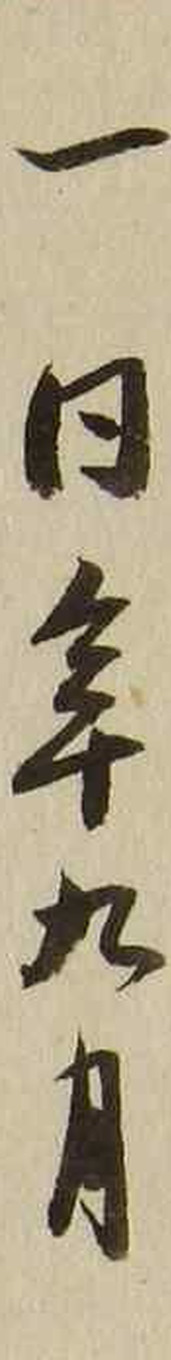一同年九月
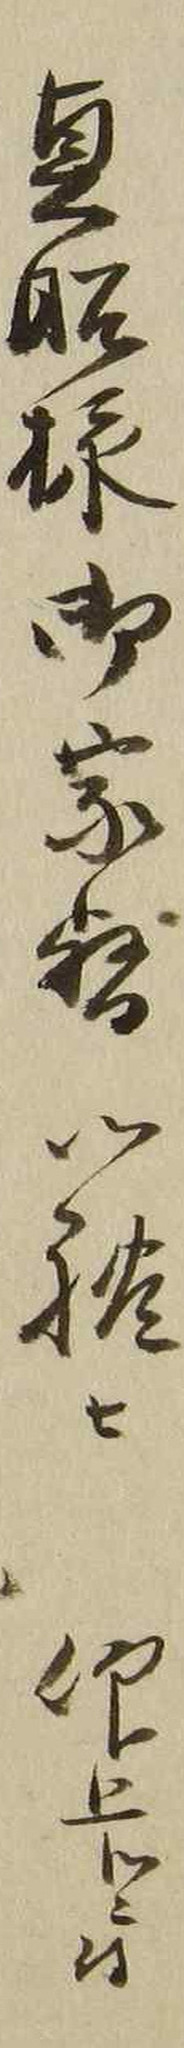貞昭様御家督御礼被仰上候に付
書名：諸士系譜　巻之269　さ之部1
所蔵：会津若松市立会津図書館
